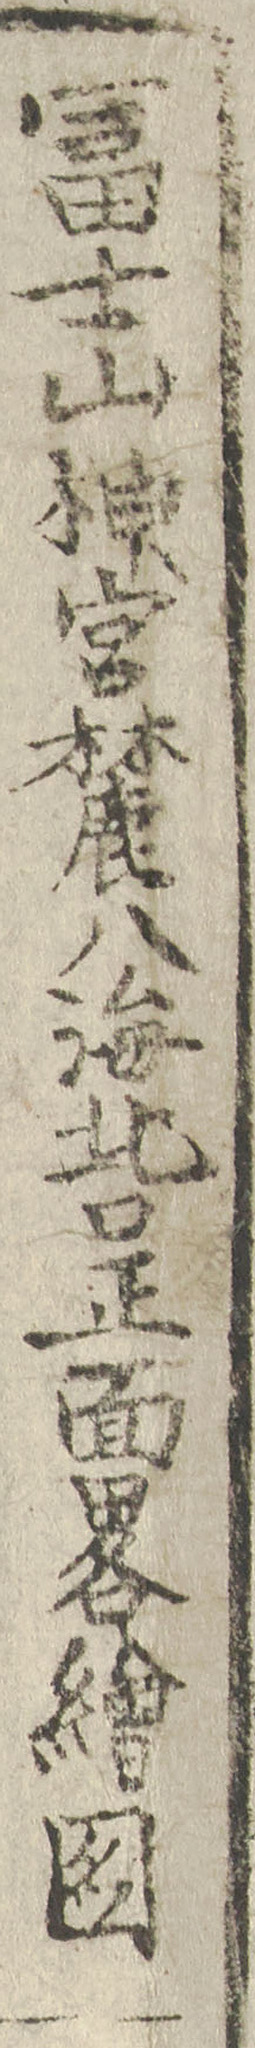冨士山神宮麓八海北口正面畧絵図
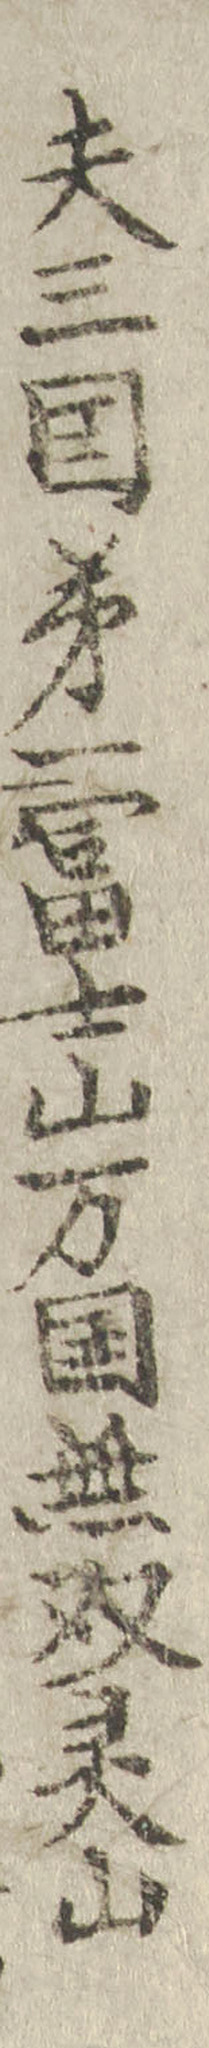夫三国第一冨士山万国無双霊山
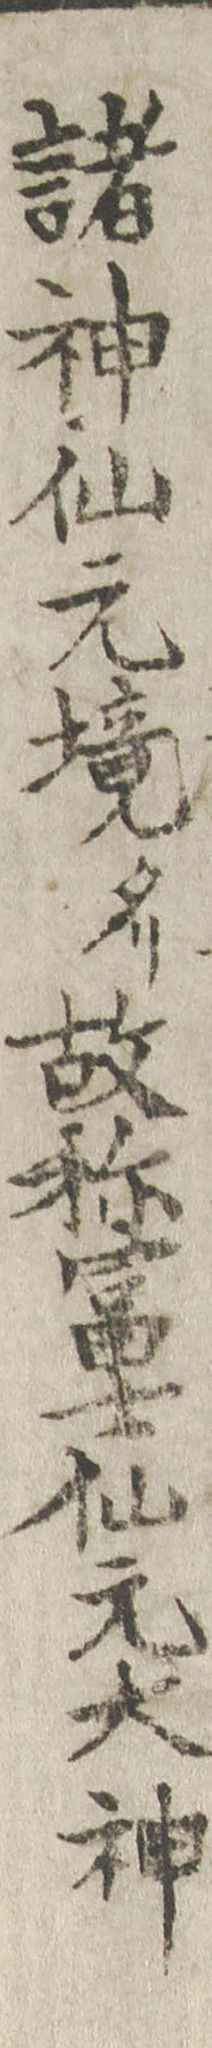諸神仙元境タリ故称冨士仙元大神
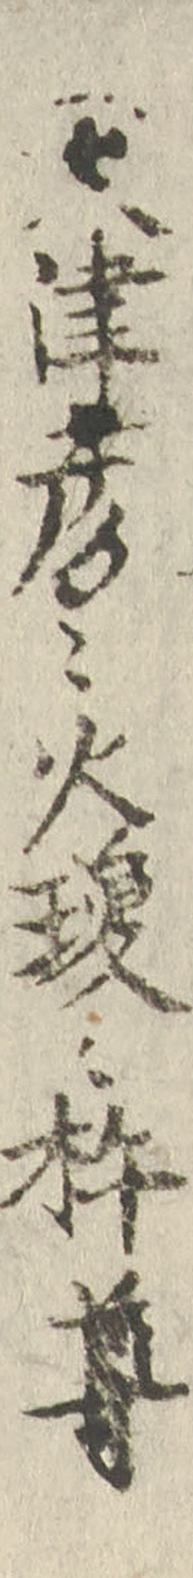天津彦々火瓊々杵尊
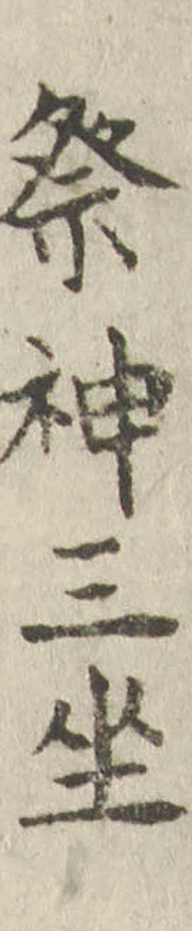祭神三坐
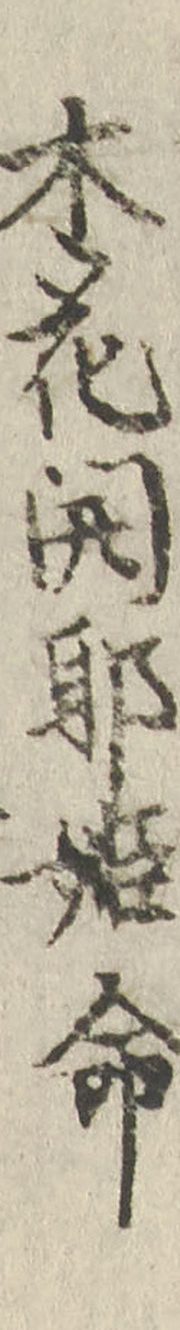木花開耶姫命
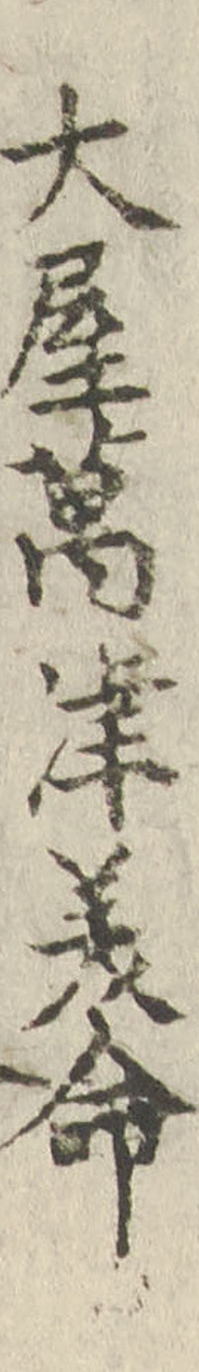大屋万津美命
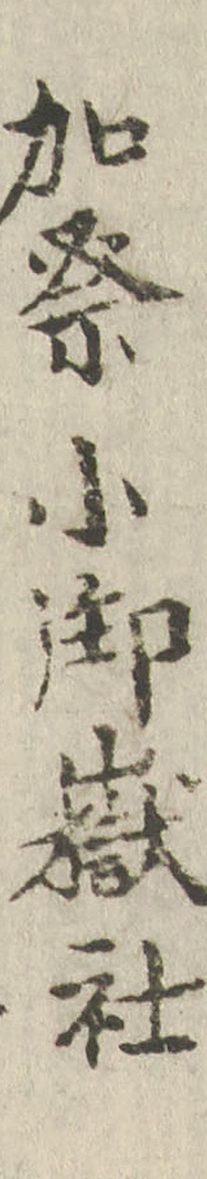加祭小御嶽社
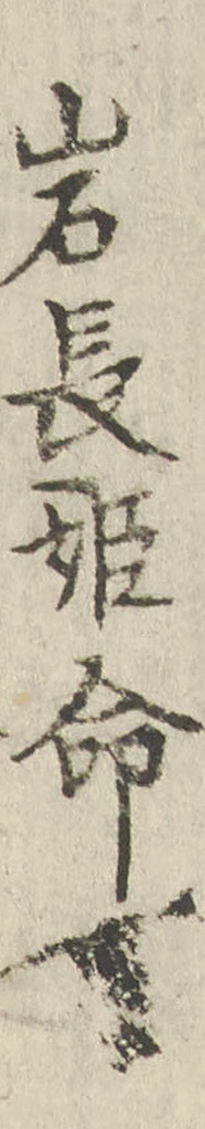岩長姫命
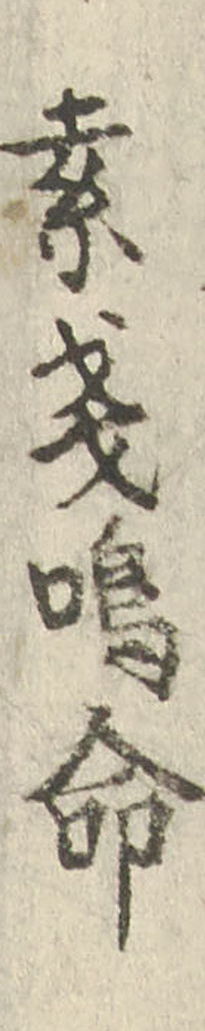素戔鳴命
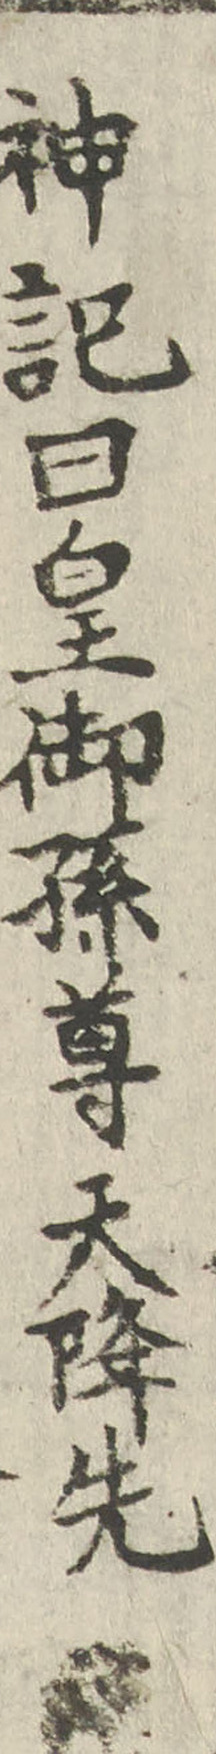神記曰皇御孫命天降先
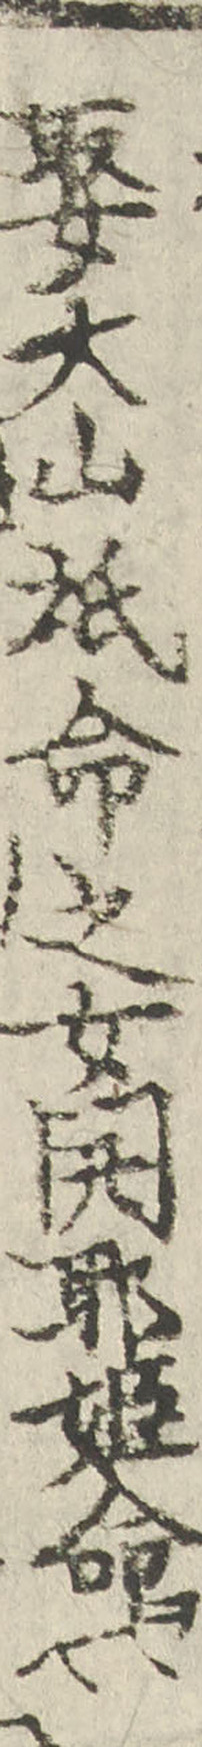娶大山祇命之女開耶姫命
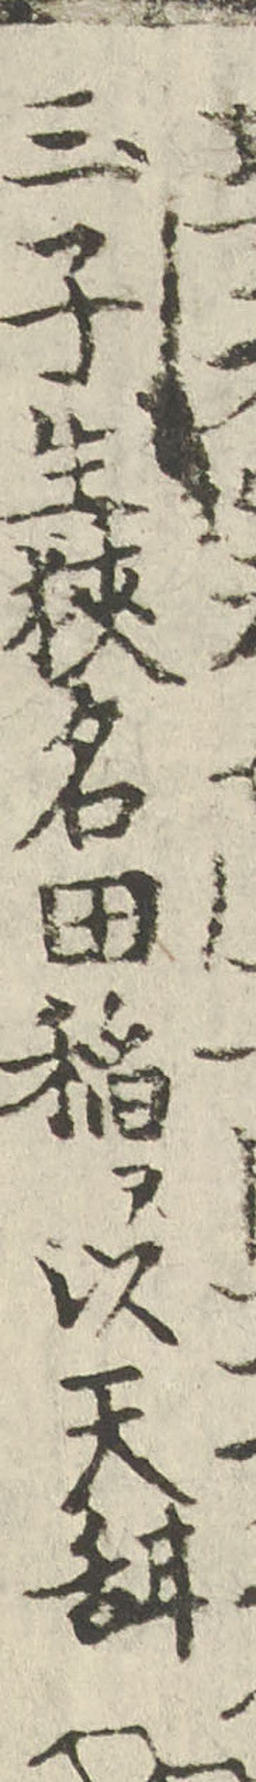三子生狭名田稲ヲ以天甜
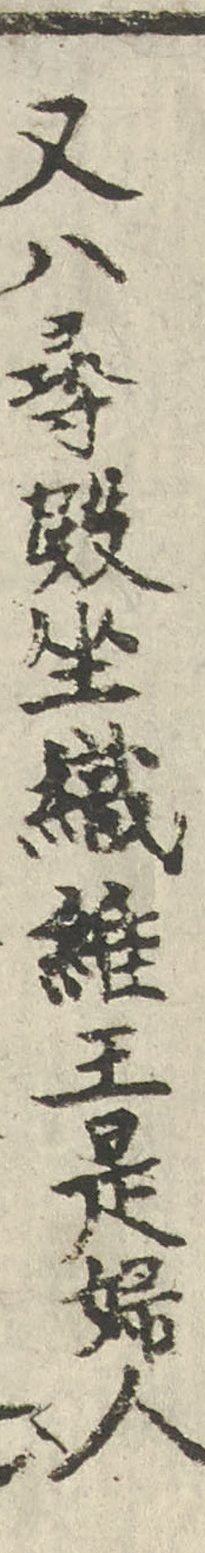又ハ尋疑坐繊維王是婦人
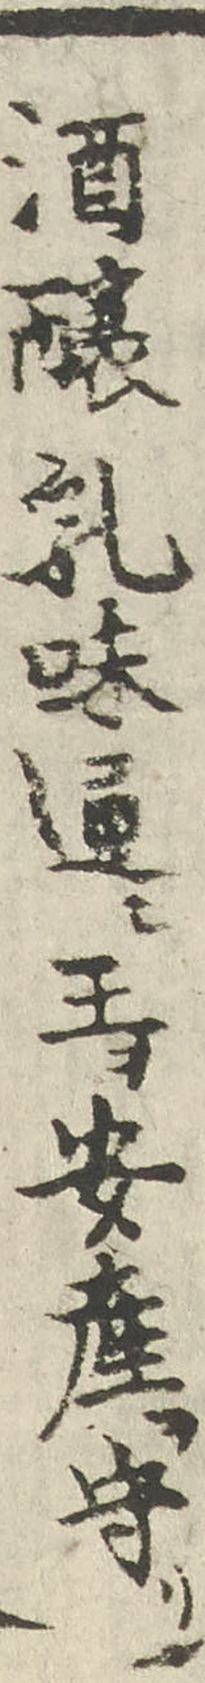酒醸乳味通シ王ノ安産ヲ守リ
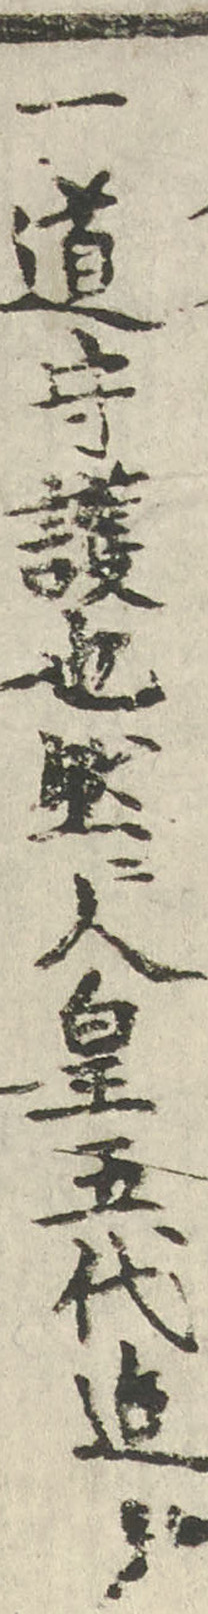一道守護也ニ人皇五代迄
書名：富士山神宮麓八海北口正面略絵図
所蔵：東京大学総合図書館 General Library in the University of Tokyo, JAPAN
